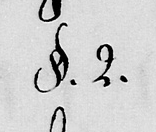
§. 2.
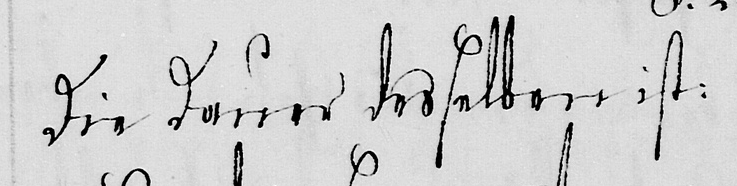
Die Dauer desselben ist:
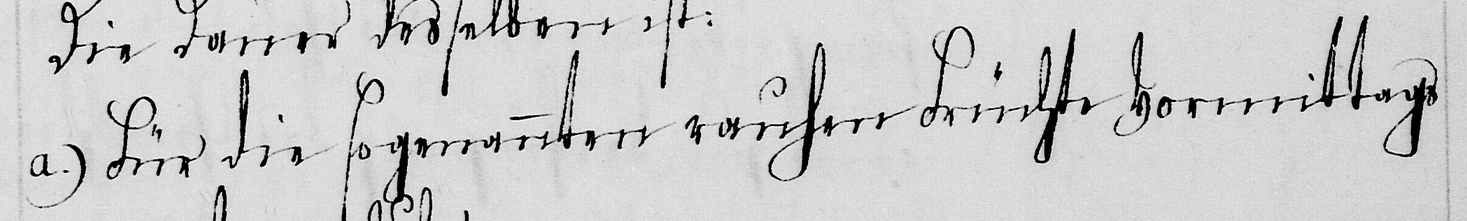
a.) Für die sogenannten rauhen Früchte Vormittags
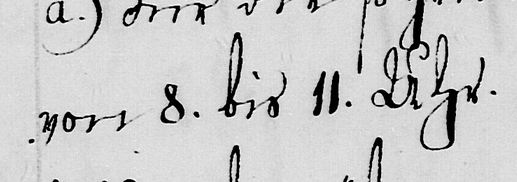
von 8. bis 11. Uhr.
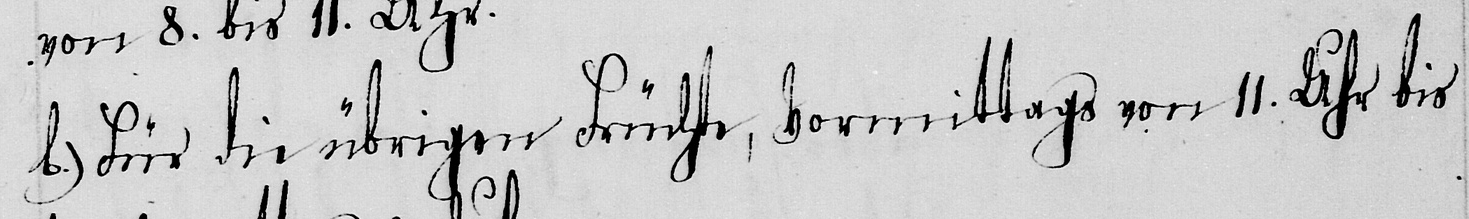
b.) Für die übrigen Früchte, Vormittags von 11. Uhr bis
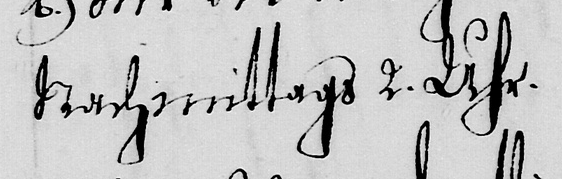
Nachmittags 2. Uhr.
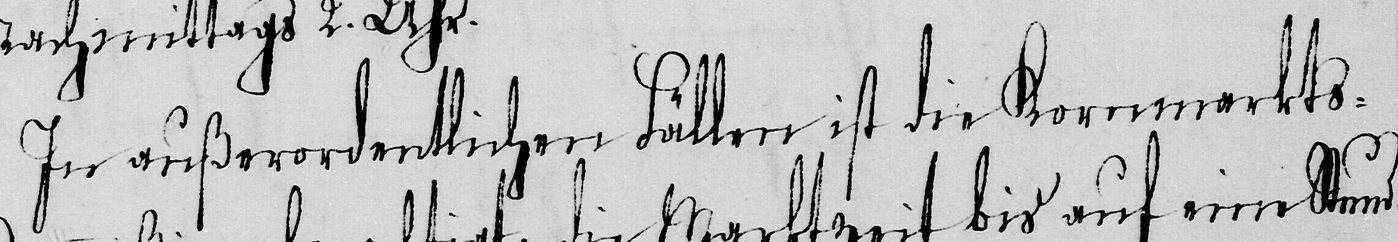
In außerordentlichen Fällen ist die Kornmarkts-C¬
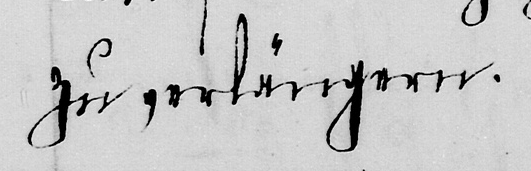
zu verlängern.
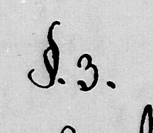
§. 3.
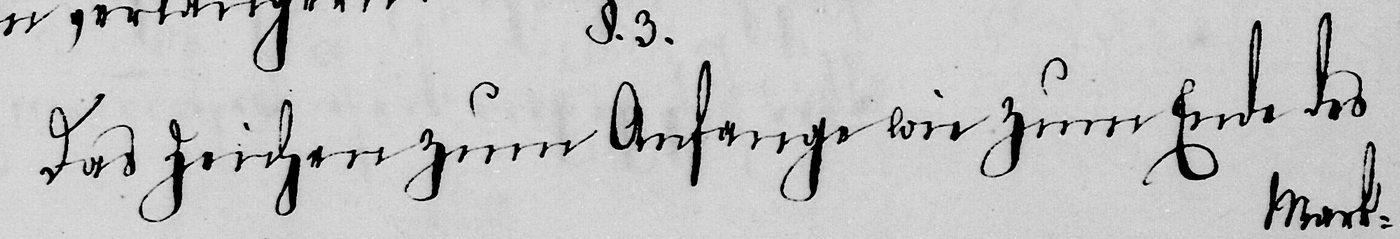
Das Zeichen zum Anfange wie zum Ende des
